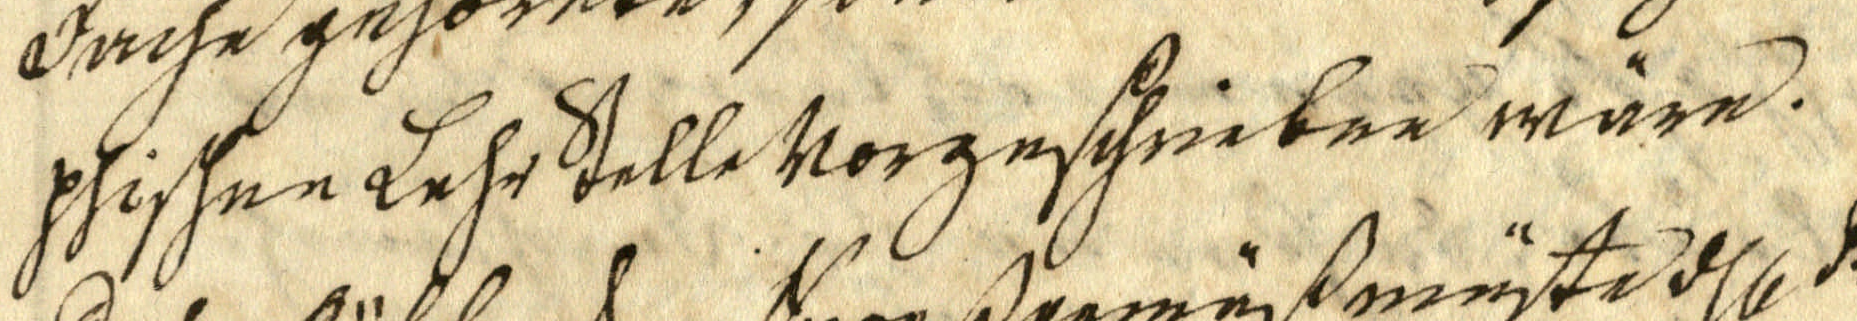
phischen LehrStelle vorgeschrieben wäre.
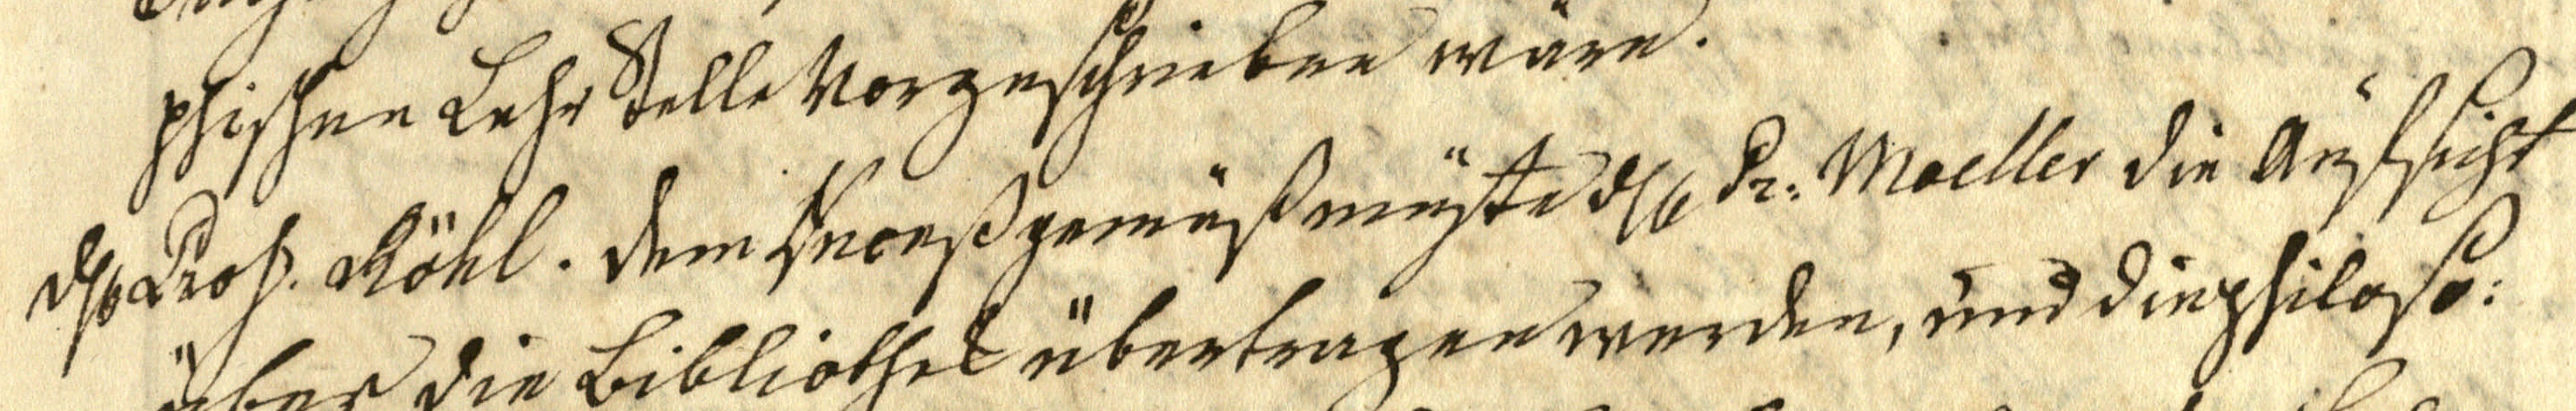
dh. Prof. Röhl. dem Receß gemäß müste dh Pr. Moeller die Aufsicht
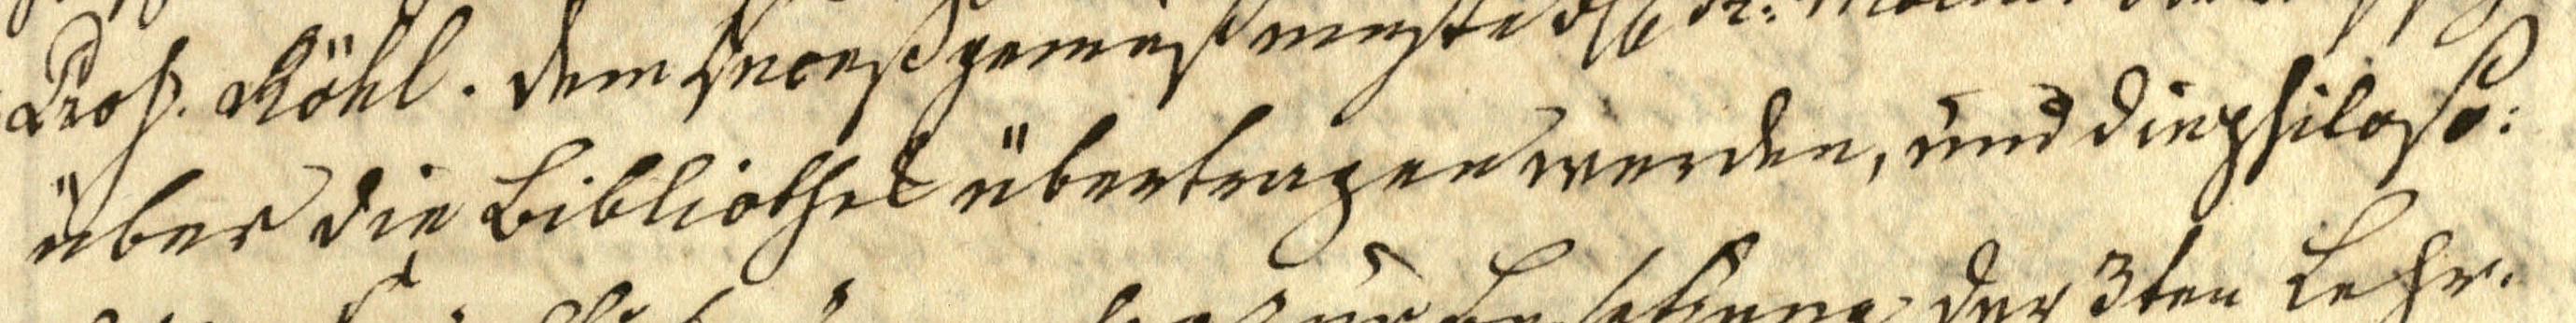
über die Bibliothek übertragen werden, und diephiloso¬
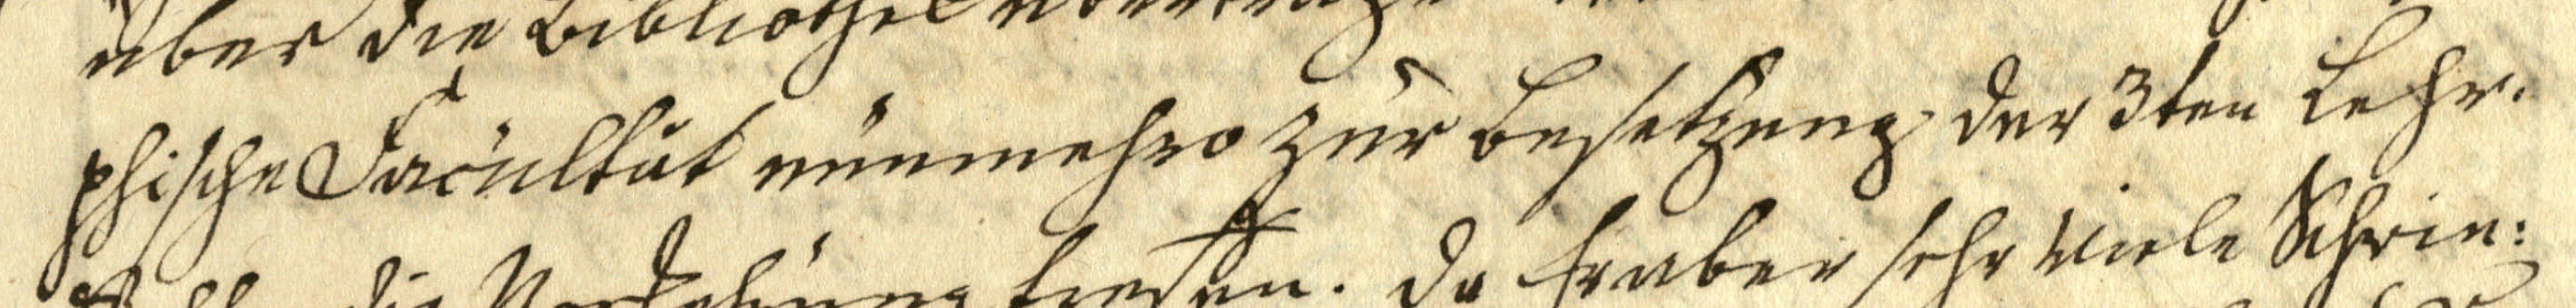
phische Facultät nunmehro zur Besetzung der 3ten Lehr¬
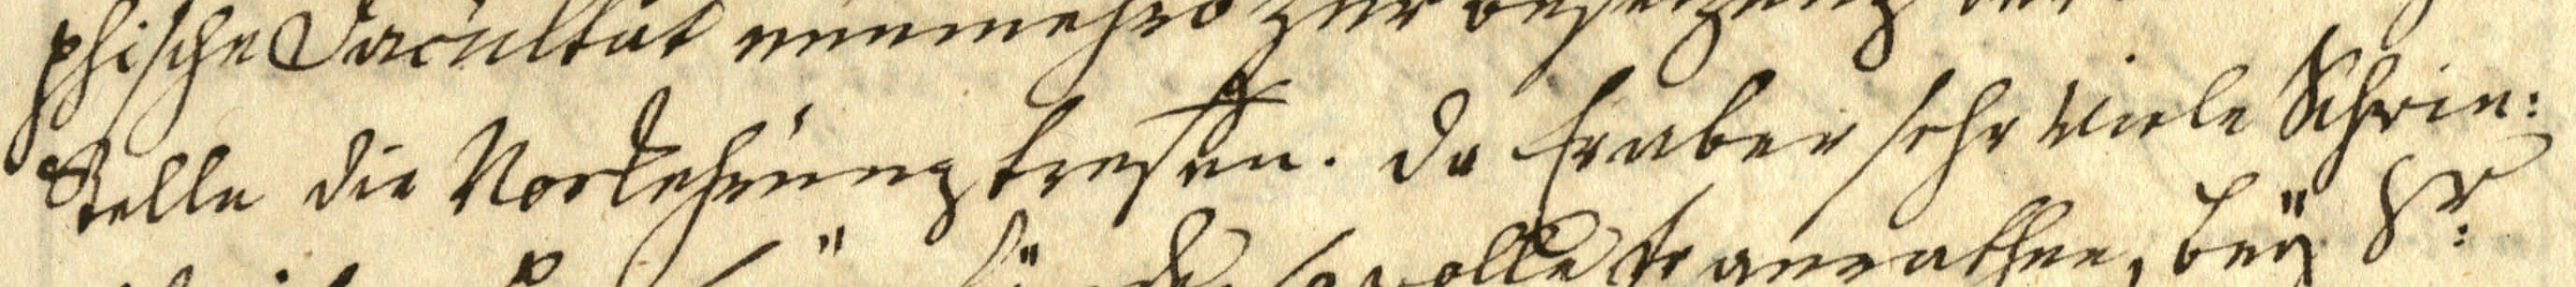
Stelle die Vorkehrung treffen. Da Er aber sehr diese Schwie¬
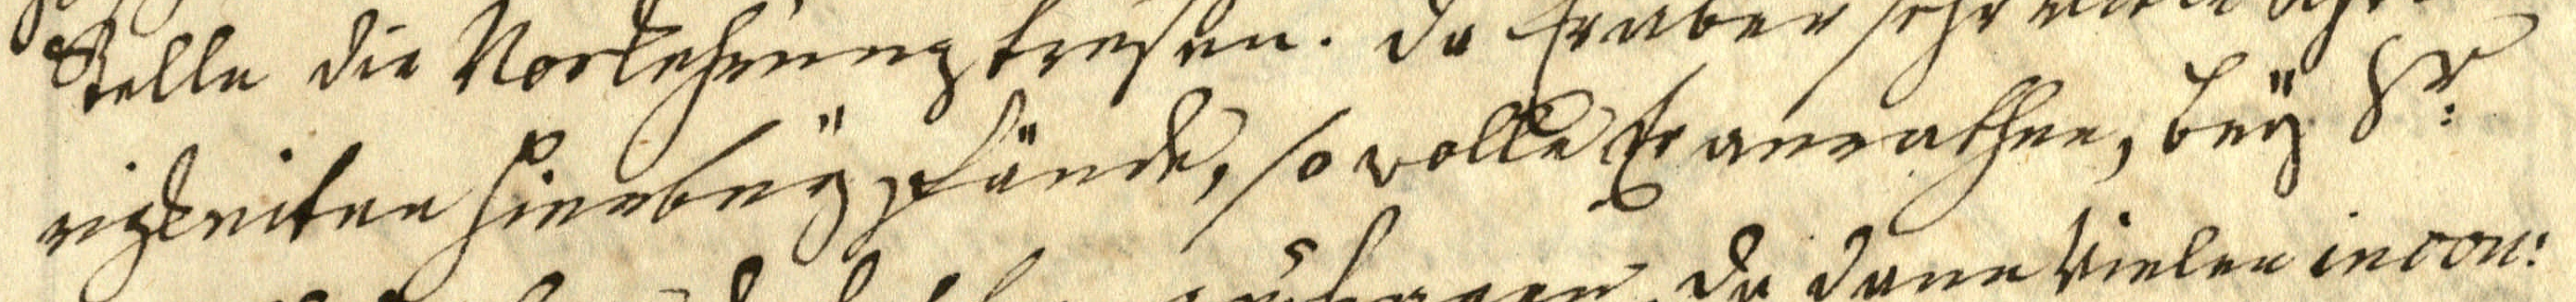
rigkeiten hierüber fände, so wolle Er anrathen, beÿ Sr
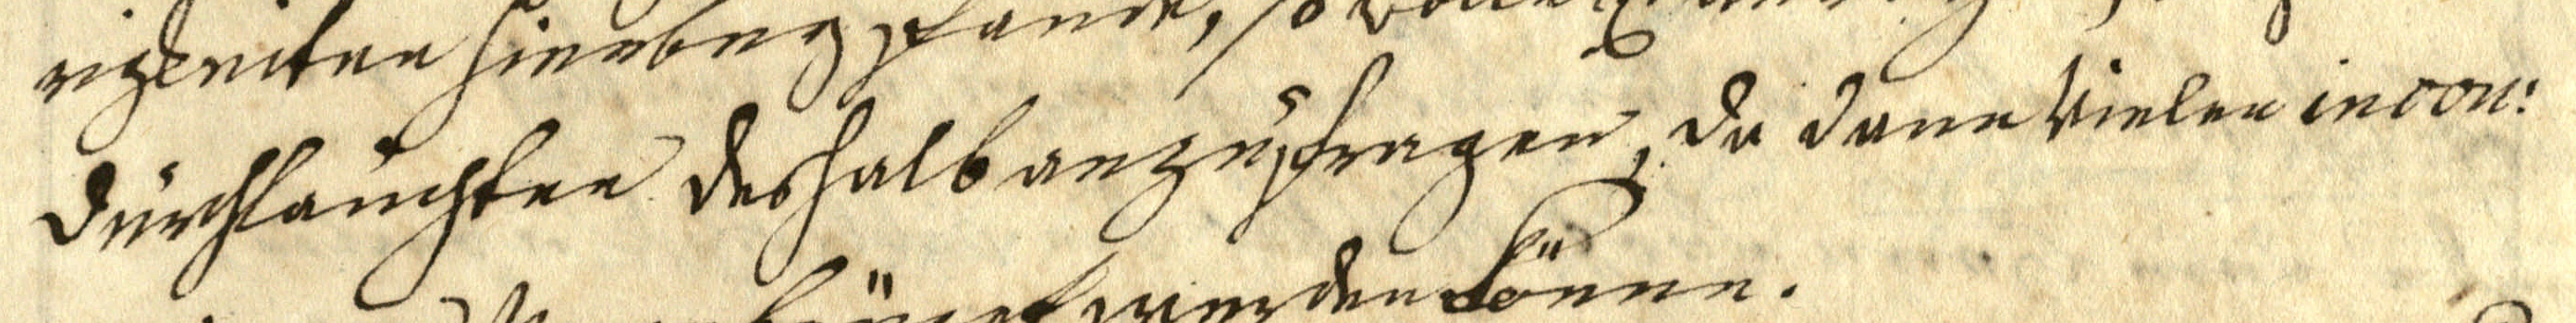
Durchlauchten deshalb anzufragen, da dann vielen incon¬
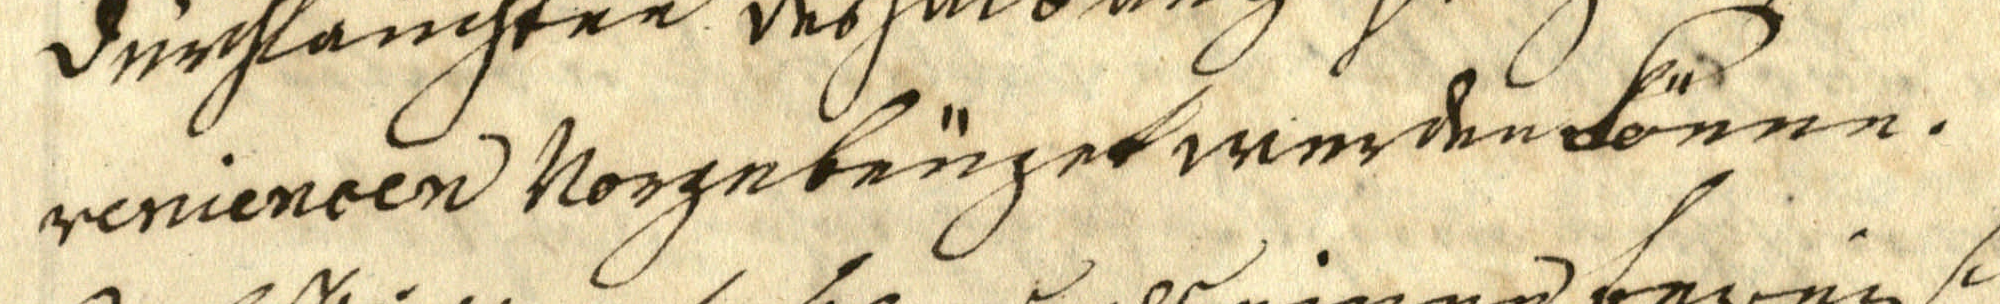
veniencen vorgebeuget werden könne.
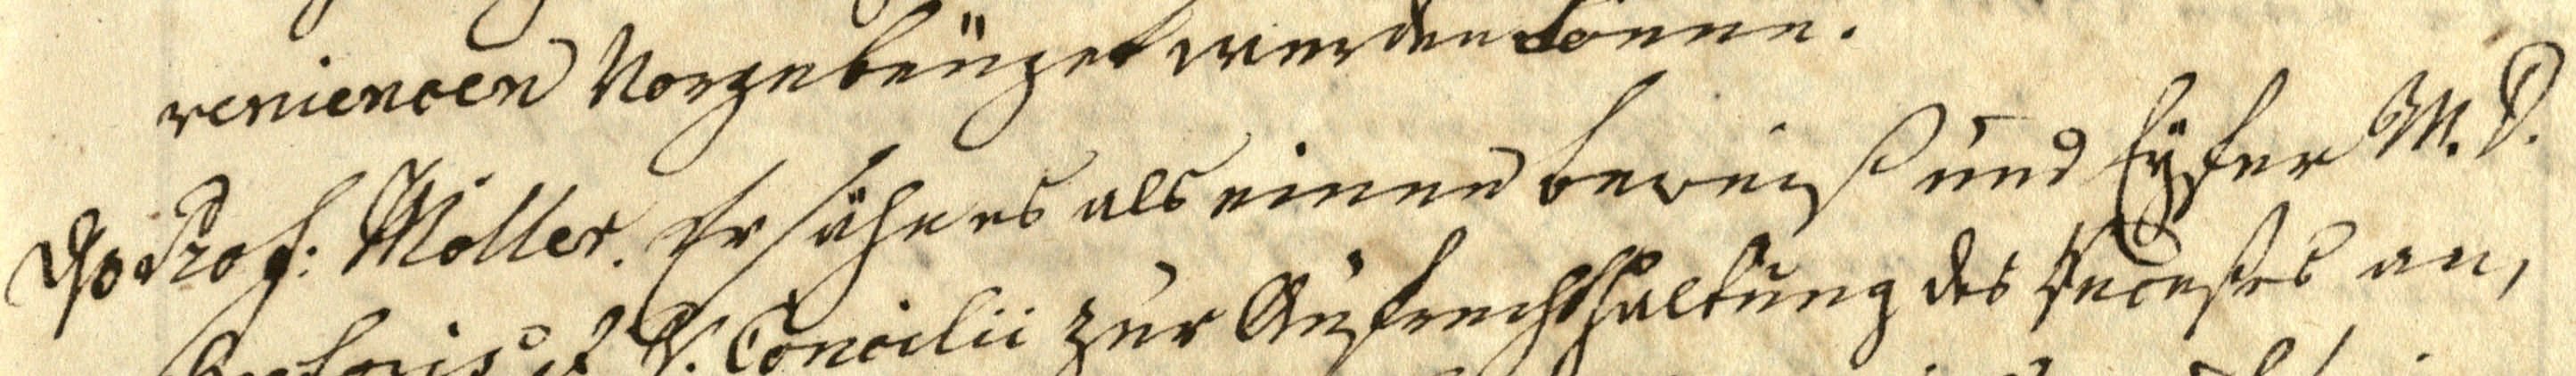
dh Prof. Möller. Er sähe es als einen Beweis und Eÿfer M.D..
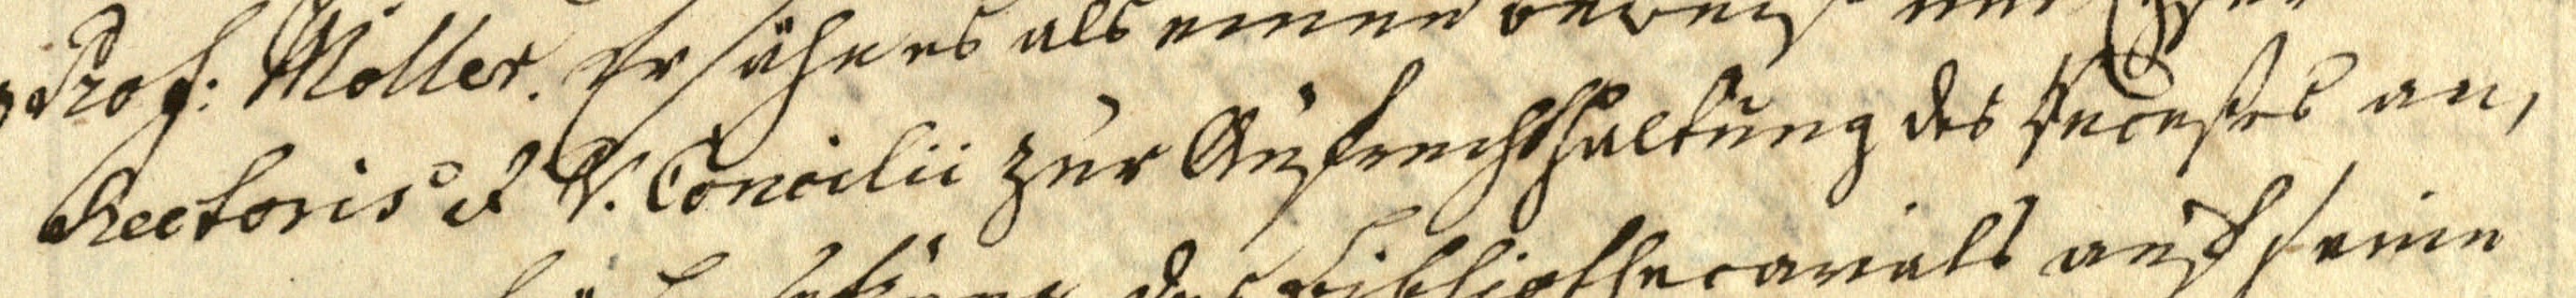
Rectoris et V. Concilii zur Aufrechthaltung des Receßes an,
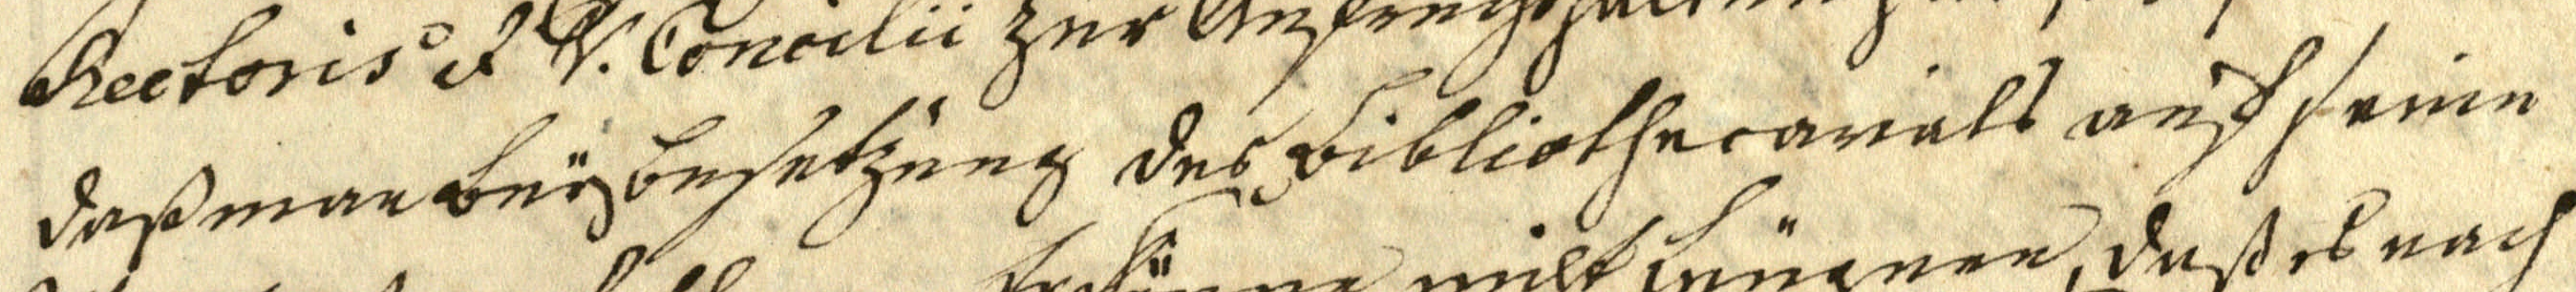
daß man bei Besetzung des Bibliothecariats auf seine
